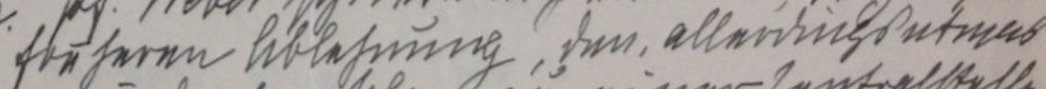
früheren Ablehnung, den allerdings etwas
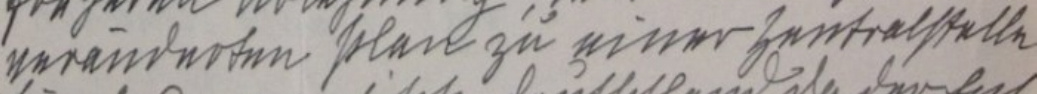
veränderten Plan zu einer Zentralstelle
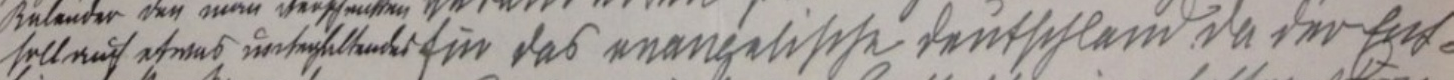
für das evangelische Deutschland. Da der Ent
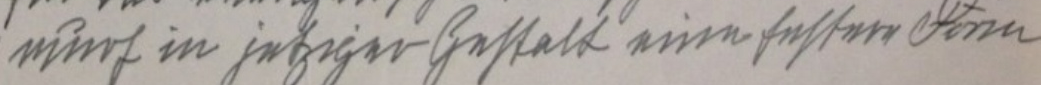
wurf in jetzuger Gestalt eine feste Form
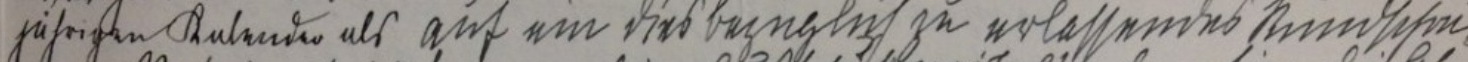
jährigen Kalender als
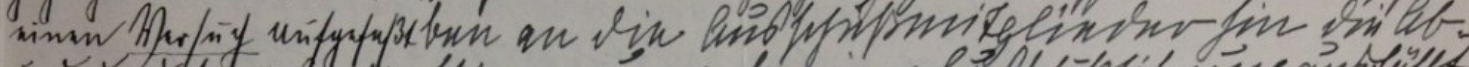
einen Versuch aufgefaßt
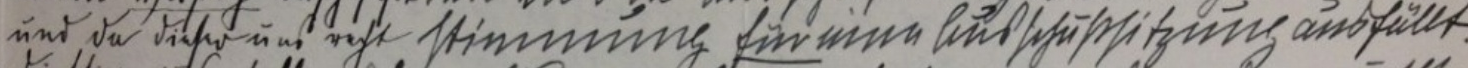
und da dieser uns recht
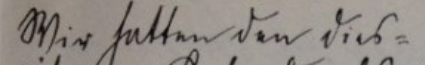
Wir hatten den dies-
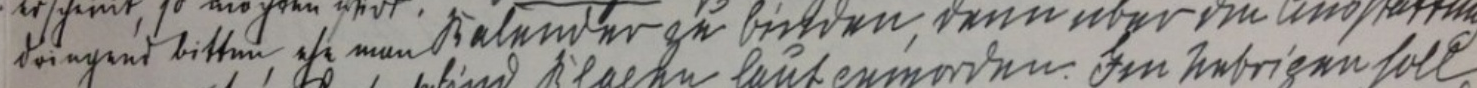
dringend bitten ehe man
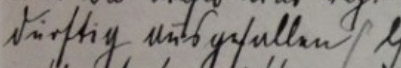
dürftig ausgfallen
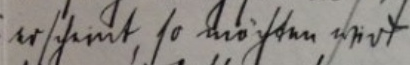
erscheint, so möchten wir
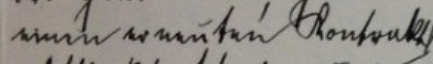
einen neuen Kontrakt
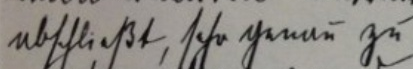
abschließt, sehr genau zu
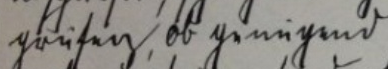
prüfen ob genügend
